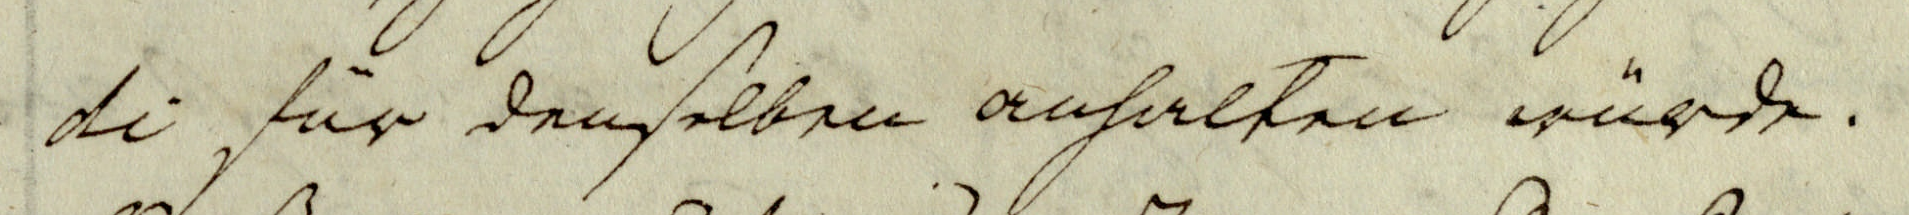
di für denselben anhalten würde.
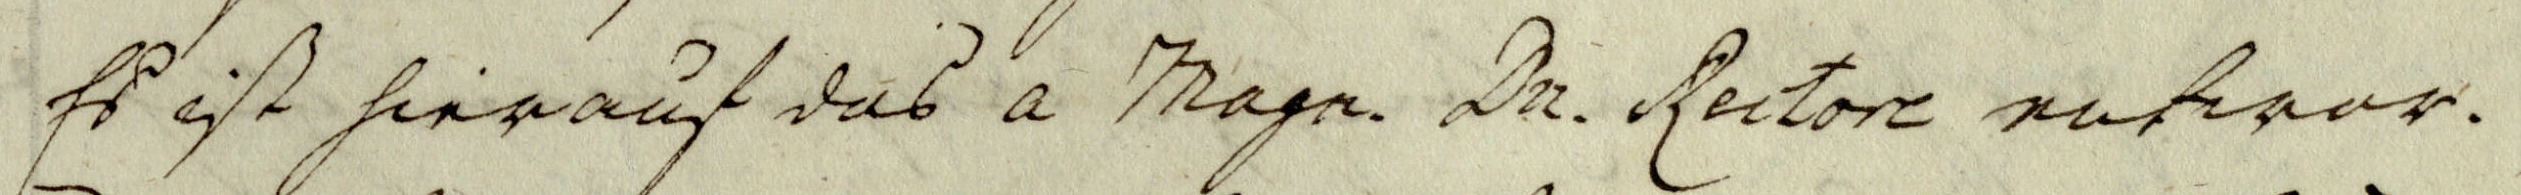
Es ist hierauf das a Magn. Dn. Rectore entwor¬
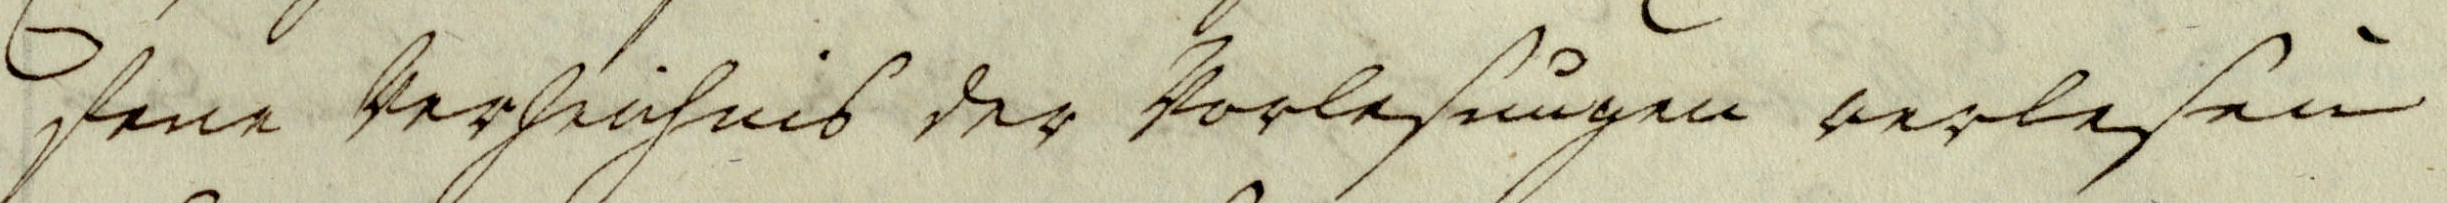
fene Verzeichnis der Vorlesungen verlesen
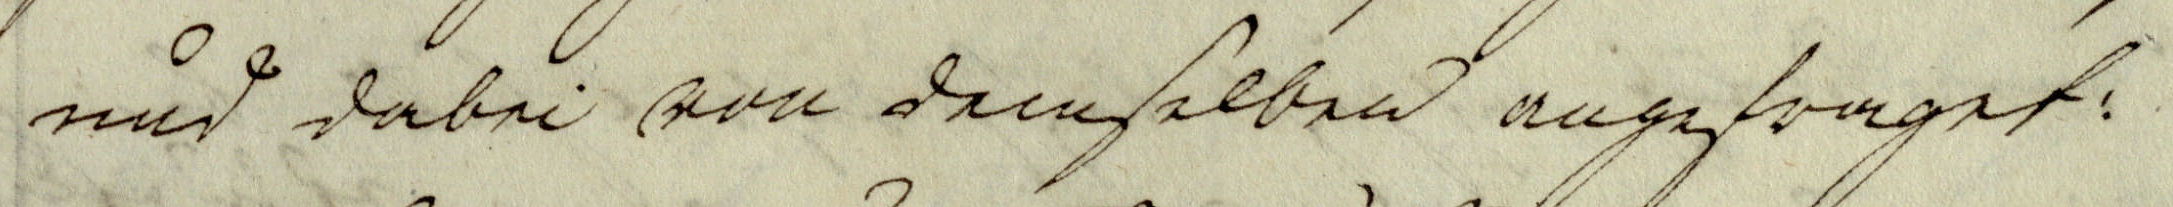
und dabei von demselben angefraget:
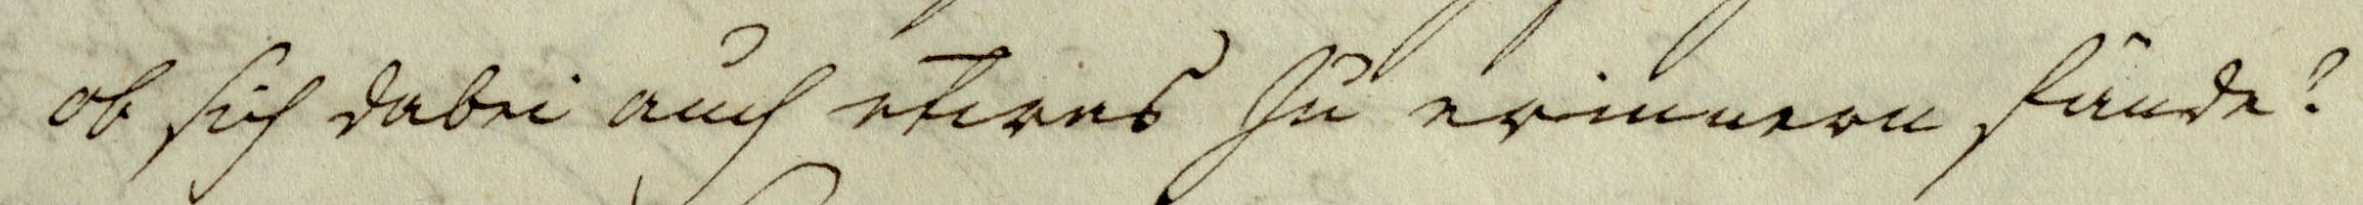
ob sich dabei auch etwas zu erinnern fände?
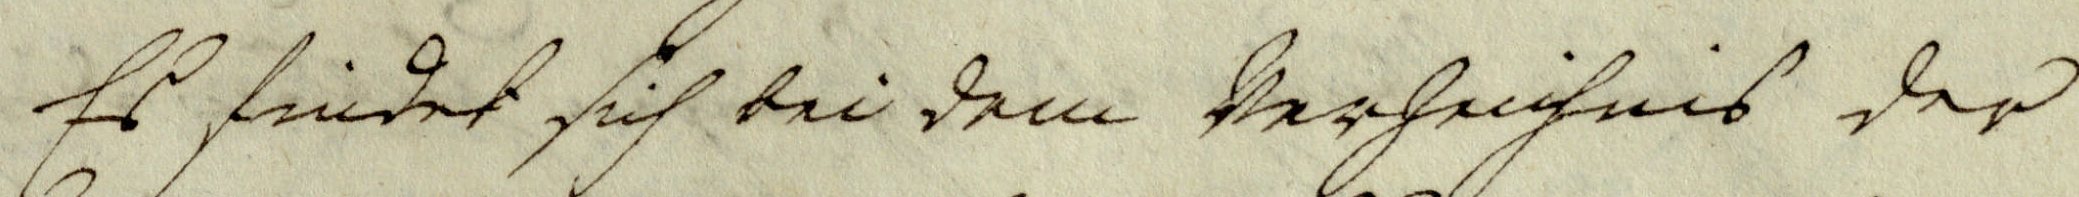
Es findet sich bei dem Verzeichnis der
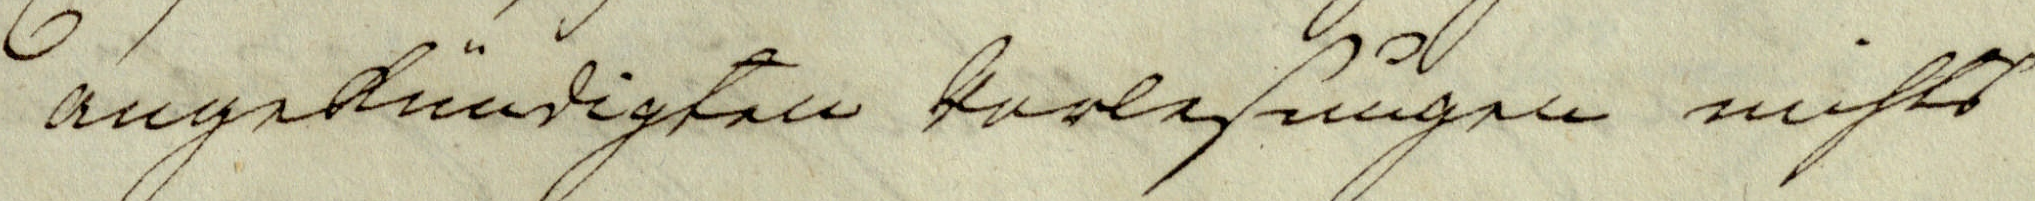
angekündigten Vorlesungen nichts
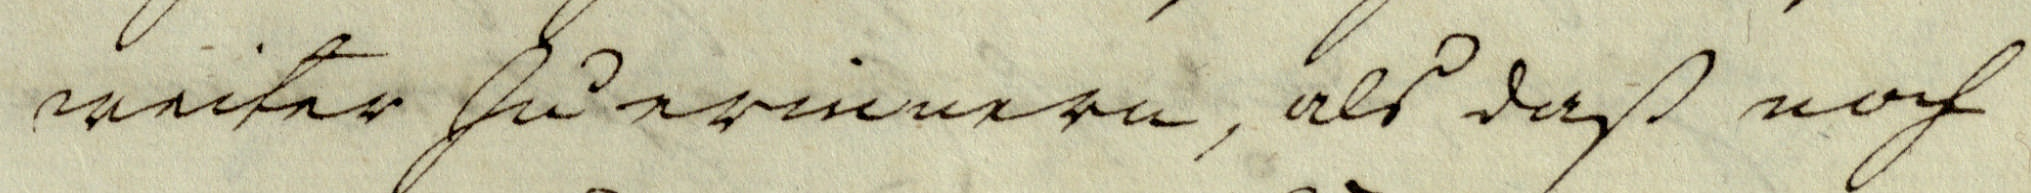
weiter zu erinnern, als daß noch
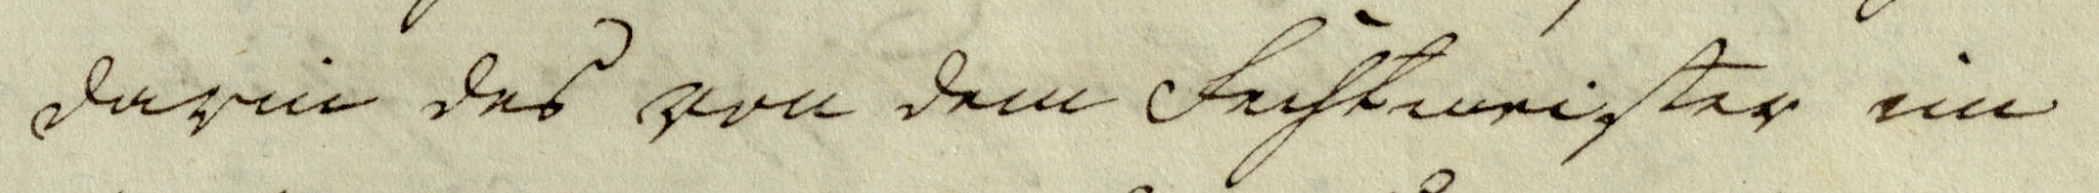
darin das von dem Fechtmeister im
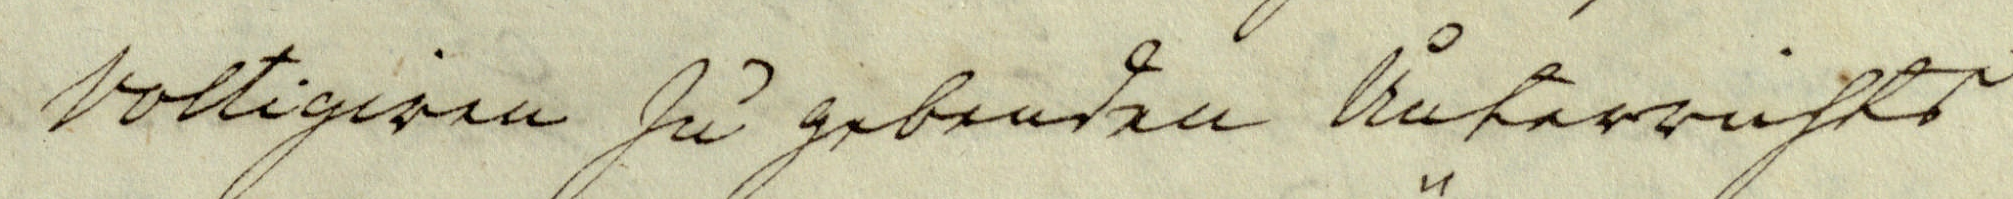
Voltigiren zu gebenden Unterrichts
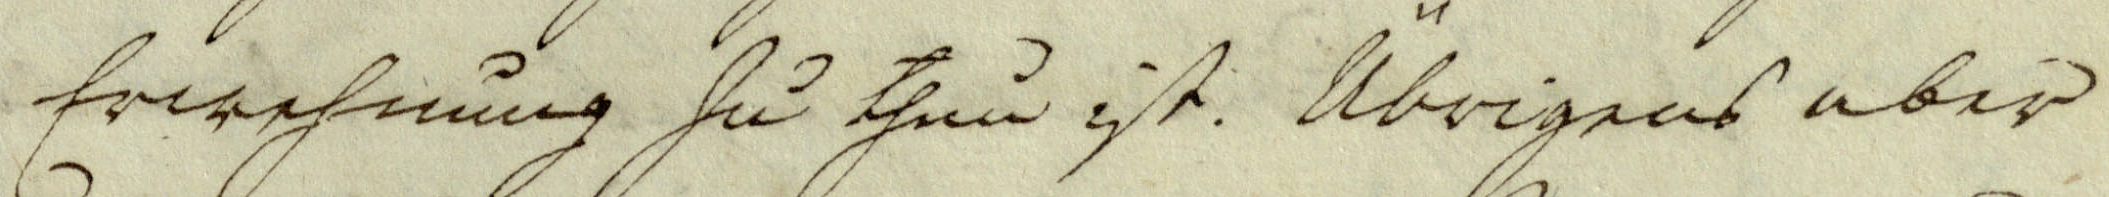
Erwehnung zu thun ist. Übrigens aber
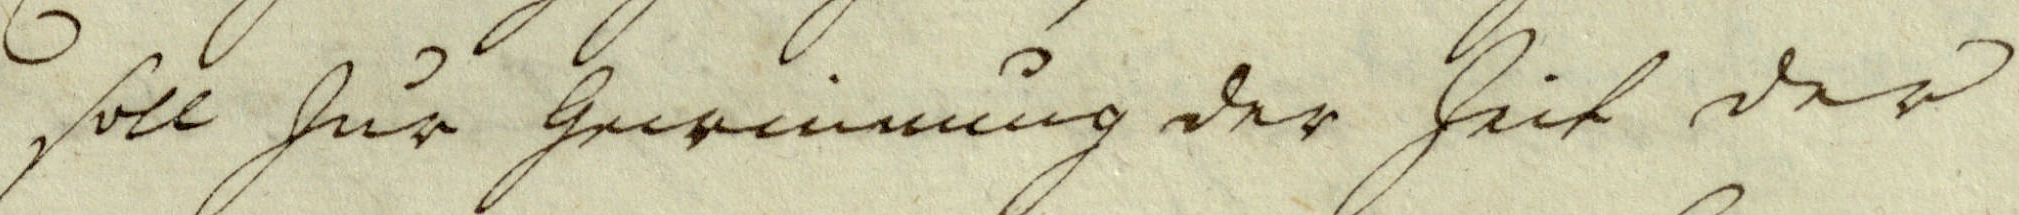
soll zur Gewinnung der Zeit der Lections
